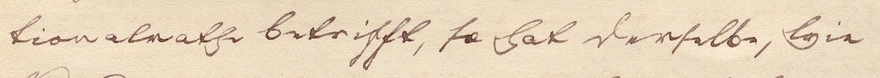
tionalrathe betrifft, so hat derselbe, wie
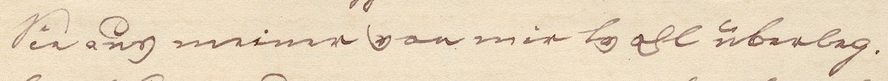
Sie aus meiner von mir wohl überleg-
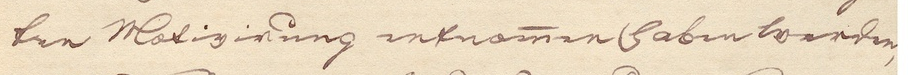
ten Motivirung entnommen haben werden,
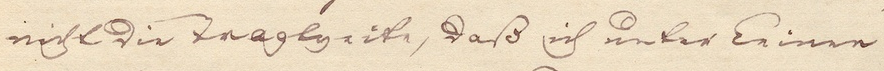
nicht die Tragweite, daß ich unter keinen
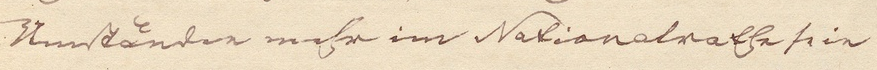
Umständen mehr im Nationalrathe sein
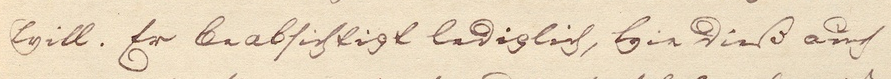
will. Er beabsichtigt lediglich, wie dieß auch
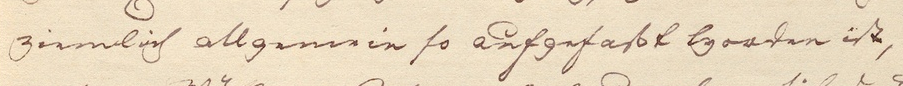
ziemlich allgemein so aufgefaßt worden ist,
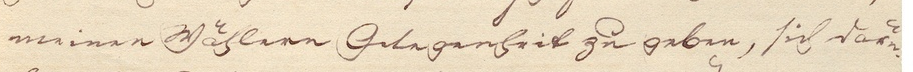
meinen Wählern Gelegenheit zu geben, sich darü-
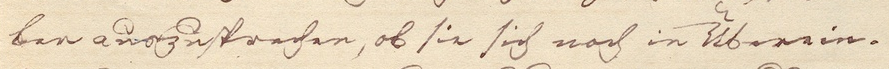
ber auszusprechen, ob sie sich noch in Überein-
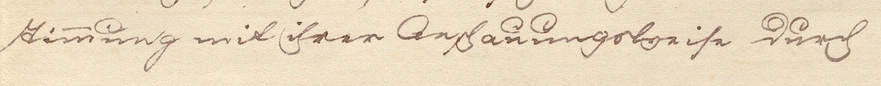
stimmung mit ihrer Anschauungsweise durch
